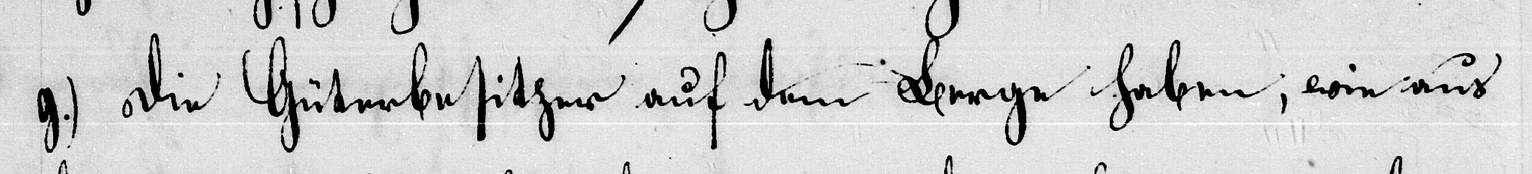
g.) Die Güterbesitzer auf dem Berge haben, wie aus
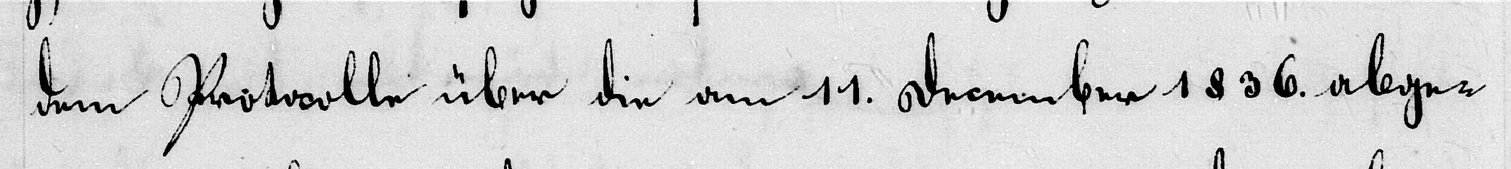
dem Protocolle über die am 11. Dezember 1836. abge¬
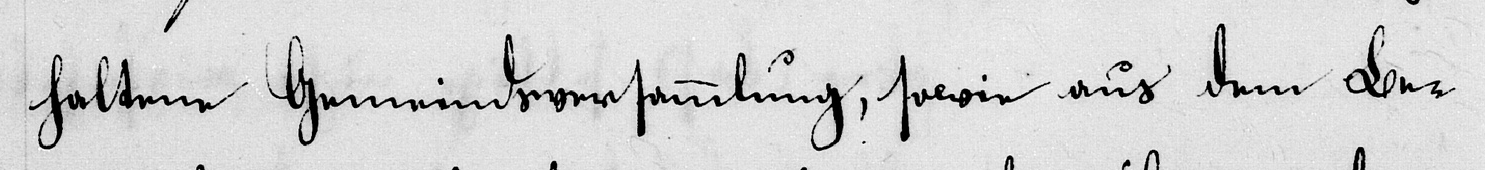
haltene Gemeindsversammlung, sowie aus dem Be¬
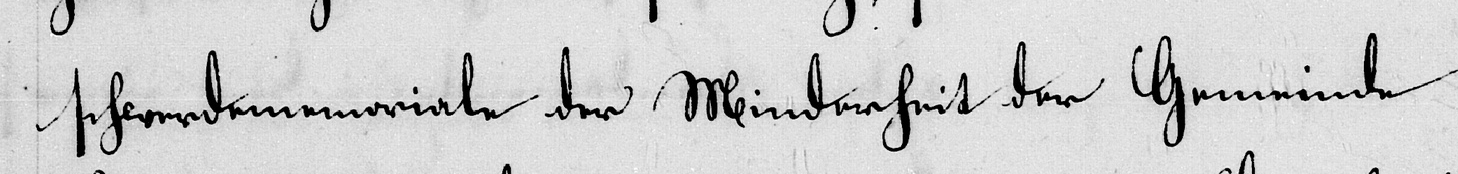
schwerdememoriale der Minderheit der Gemeinde
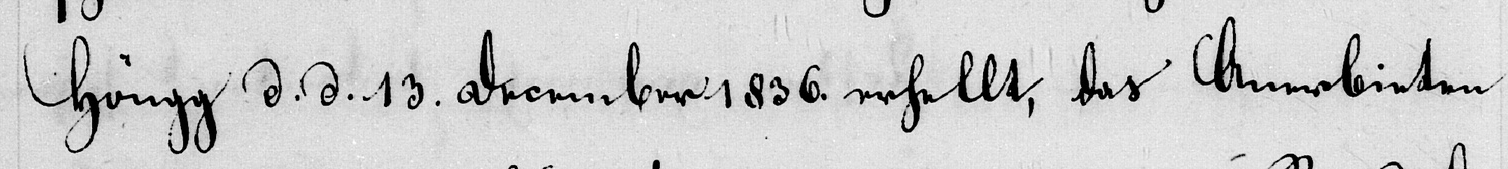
Höngg d. d. 13. December 1836. erhellt, das Anerbieten
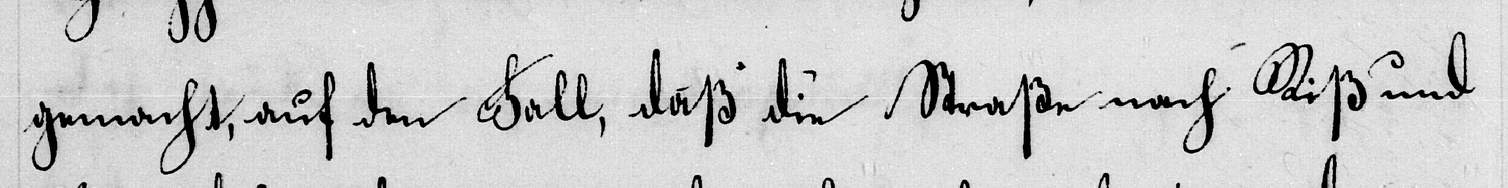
gemacht, auf den Fall, daß die Straße nach Riß und
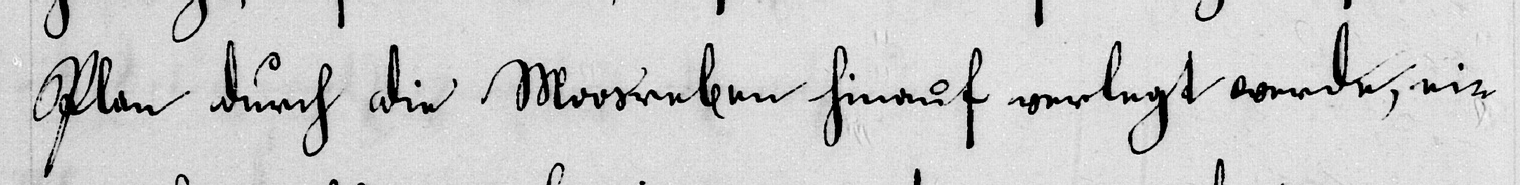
Plan durch die Moosreben hinauf verlegt werde, ei¬
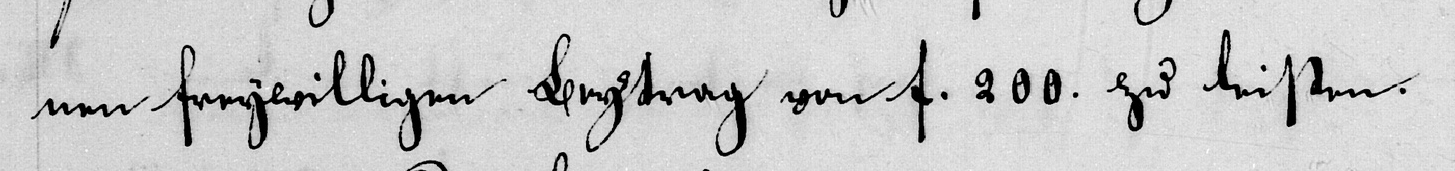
nen freywilligen Beytrag von f. 200. zu leisten.
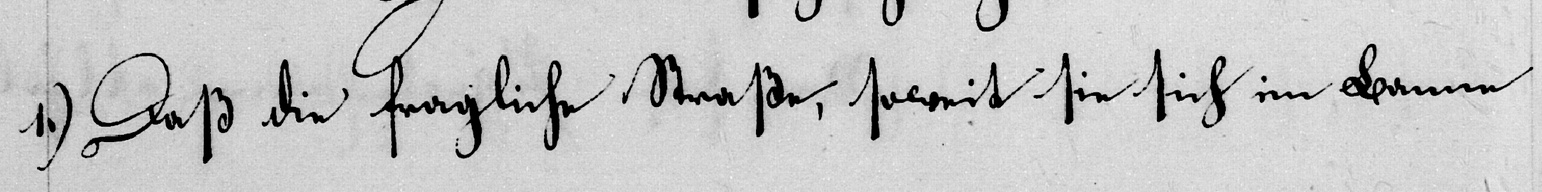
1.) Daß die fragliche Straße, soweit sie sich im Banne
